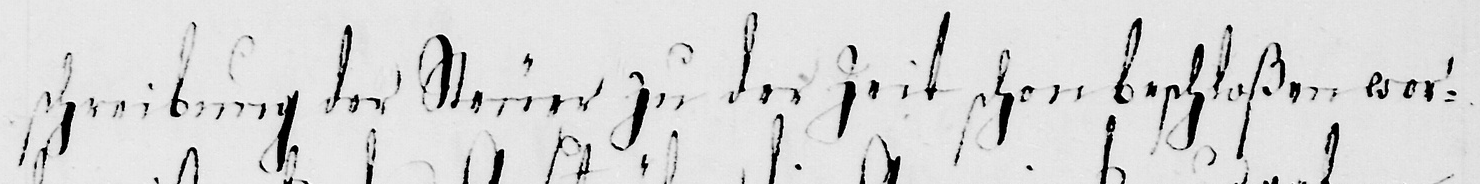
schreibung der Steuer zu der Zeit schon beschloßen wor¬
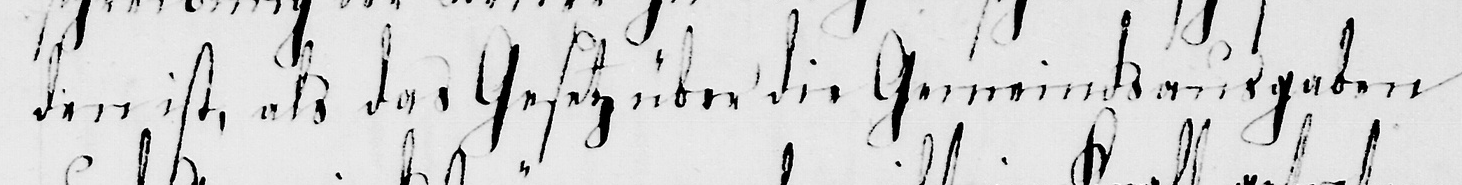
den ist, als das Gesetz über die Gemeindsausgaben
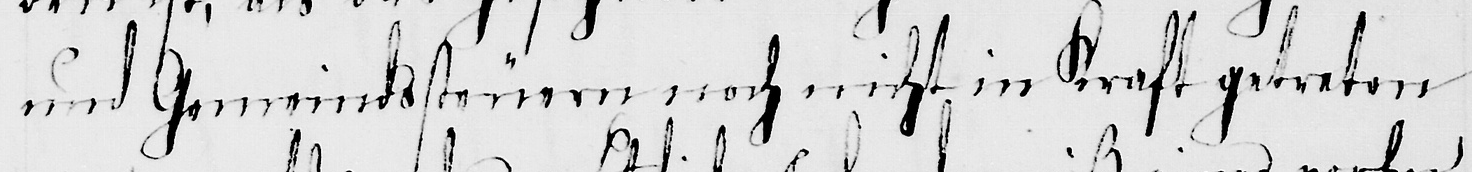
und Gemeindssteuern noch nicht in Kraft getreten
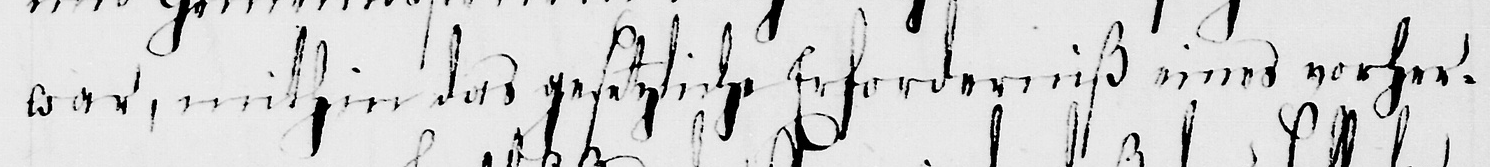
war, mithin das gesetzliche Erforderniß eines vorher¬
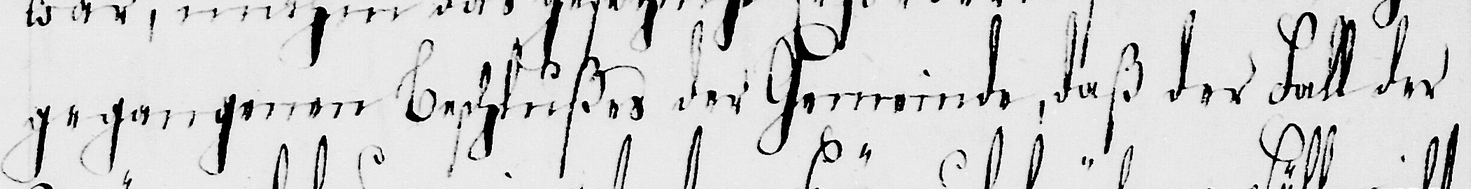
gegangenen Beschlußes der Gemeinde, daß der Fall der
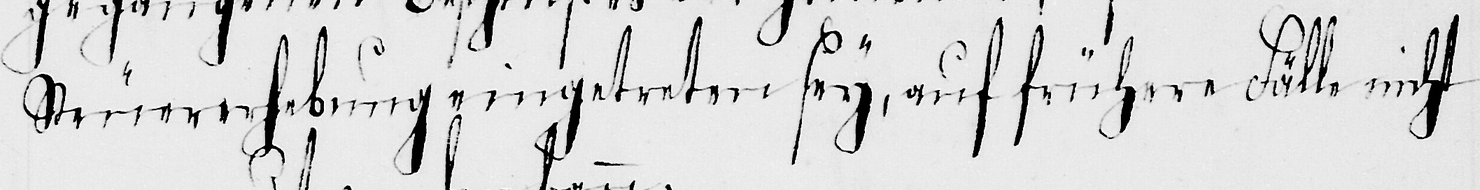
Steuererhebung eingetreten sey, auf frühere Fälle nicht
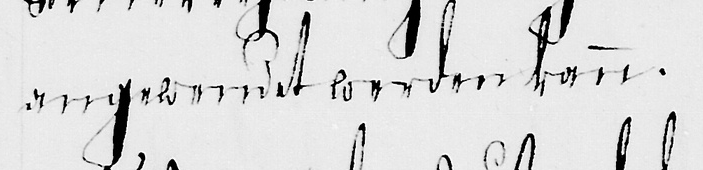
angewendet werden kann.
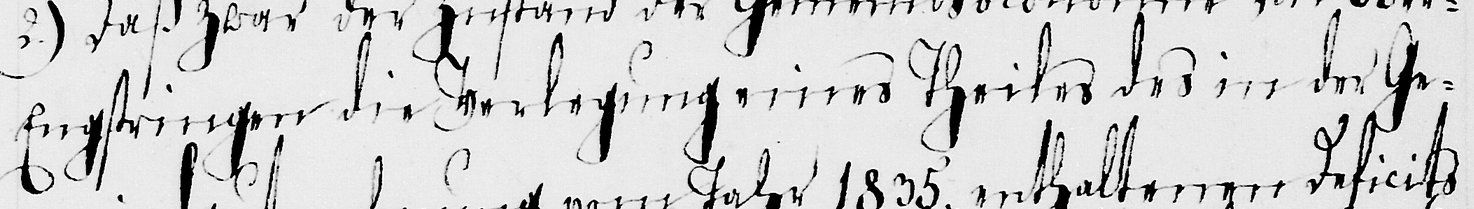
ngstringen die Verlegung eines Theiles des in der Ge¬
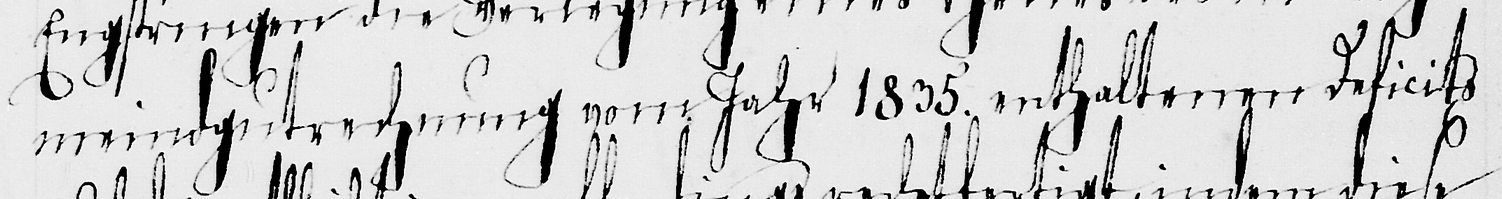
meindgutrechnung vom Jahr 1835. enthaltenen Deficits
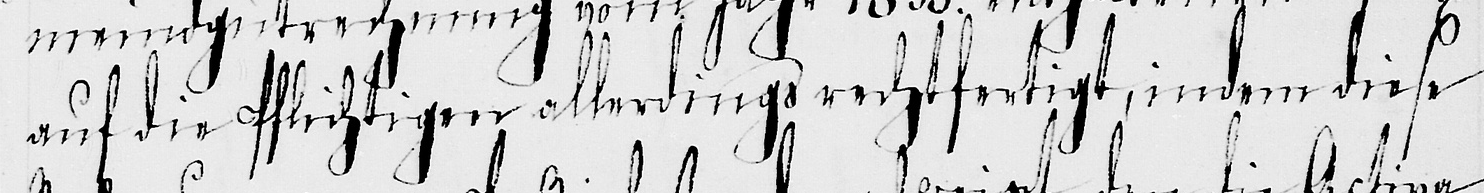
auf die Pflichtigen allerdings rechtfertigt, indem diese
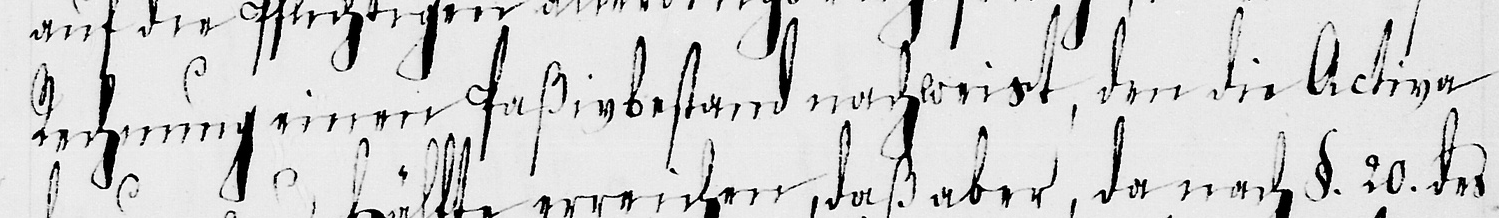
Rechnung einen Paßivbestand nachweist, den die Activa
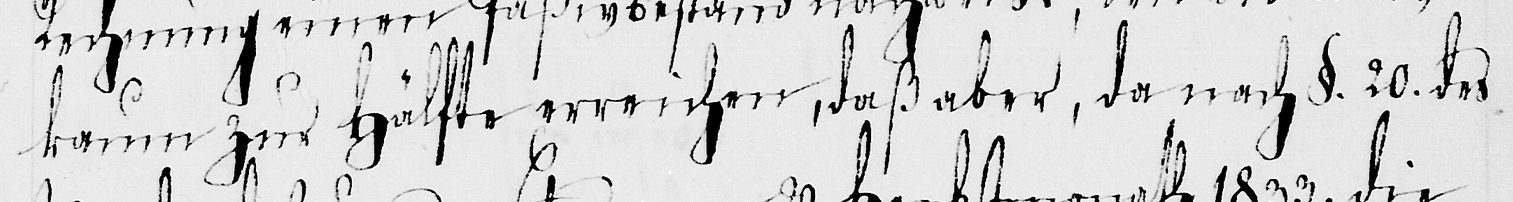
kaum zur Hälfte erreichen, daß aber, da nach §. 20. des
